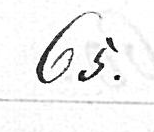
65.
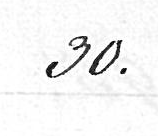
30.
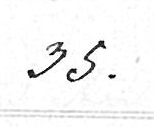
35.
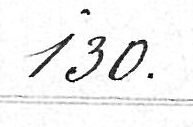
130.
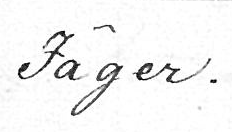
Jäger
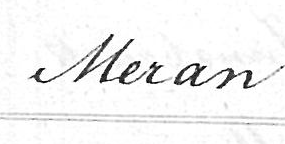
Meran
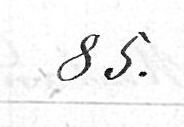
85.
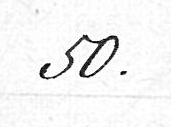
50.
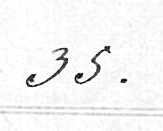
35.
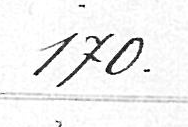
170.
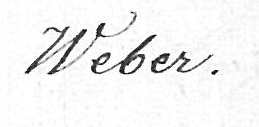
Weber
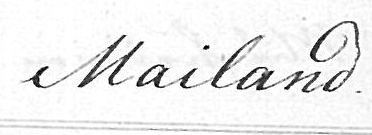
Mailand
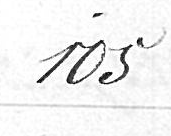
105
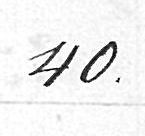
40.
